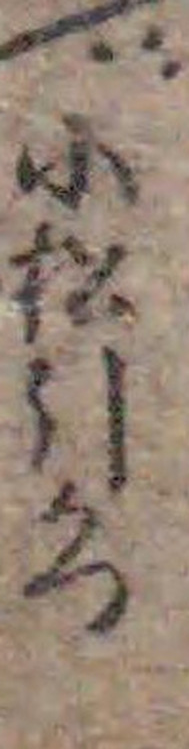小松引かつ
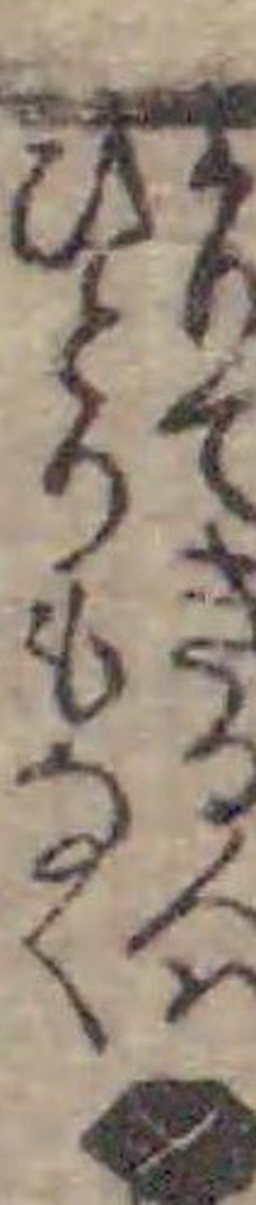ひとりもなく
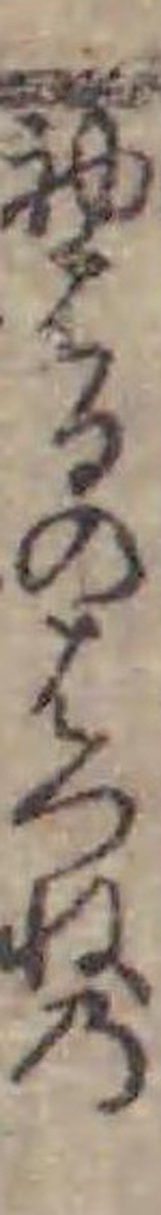初はるのはつねの
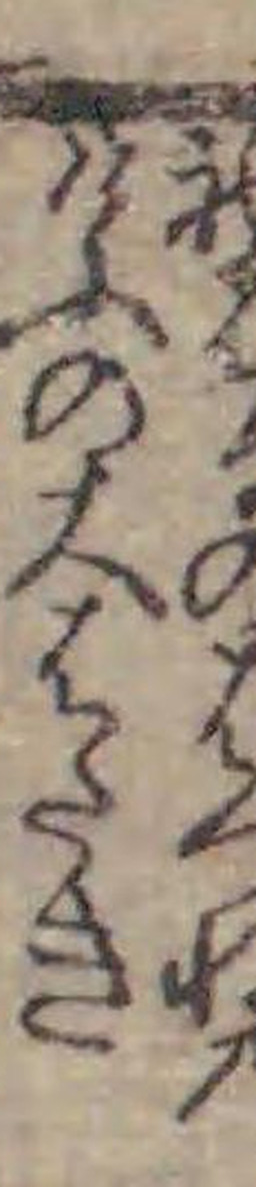けふの大はたらき
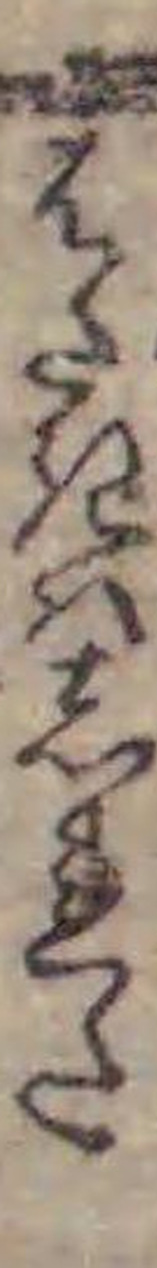はたきはしれた
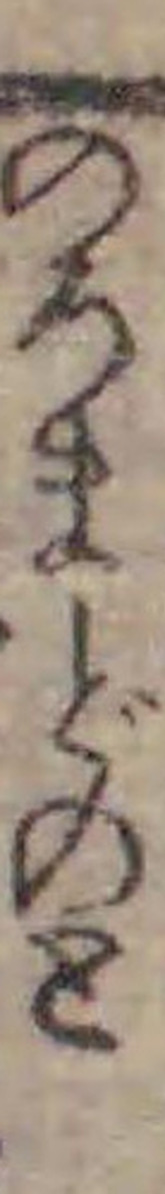のろまどのと
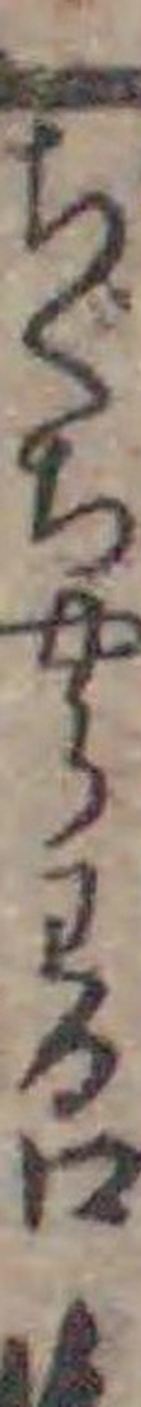ぢぐちやらわる口
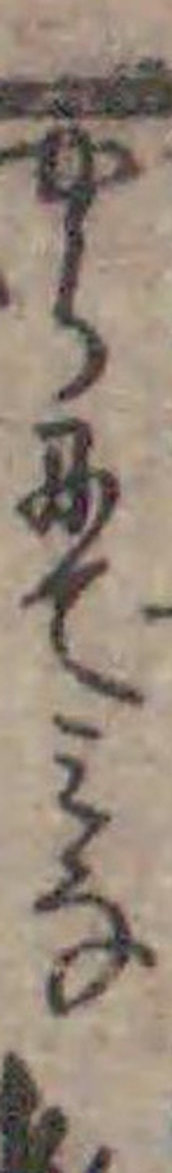やらにてみな
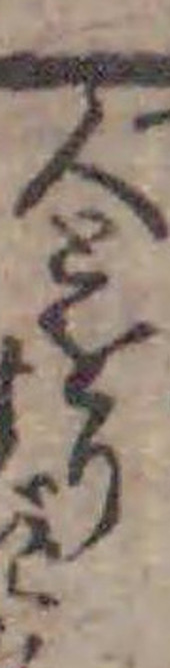人とをり

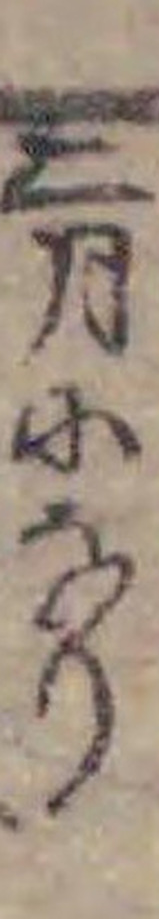二月になり
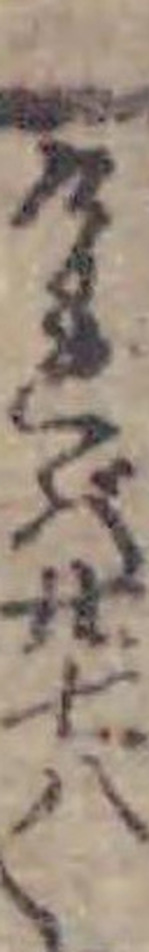ければ廿七八
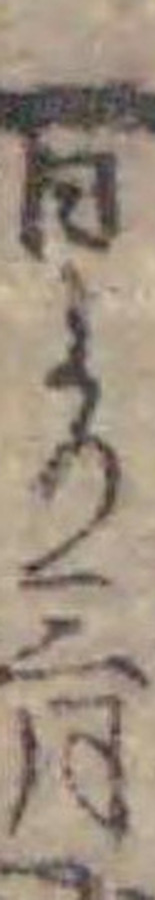日より三月
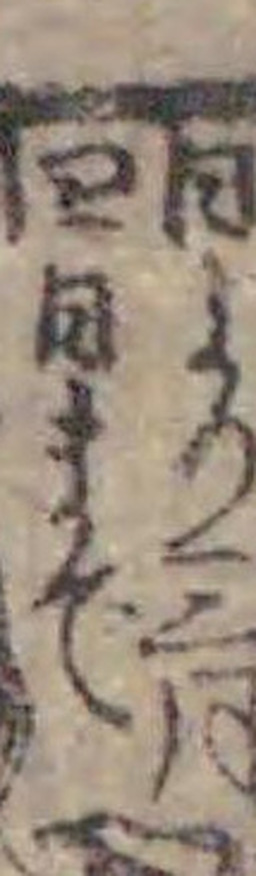四月まで
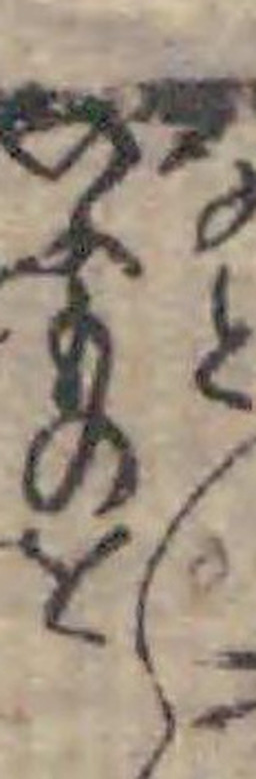いふものを
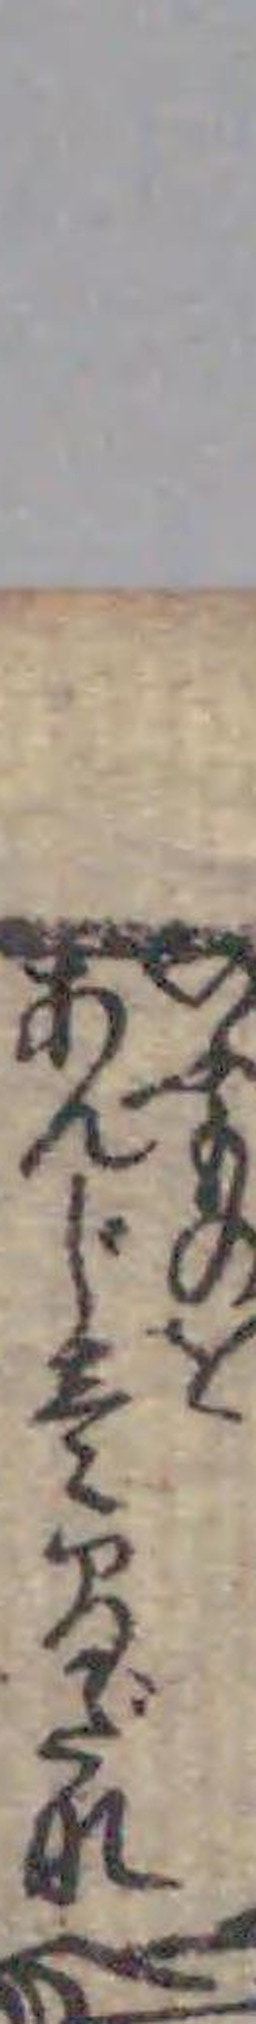あんじ壱間だれ
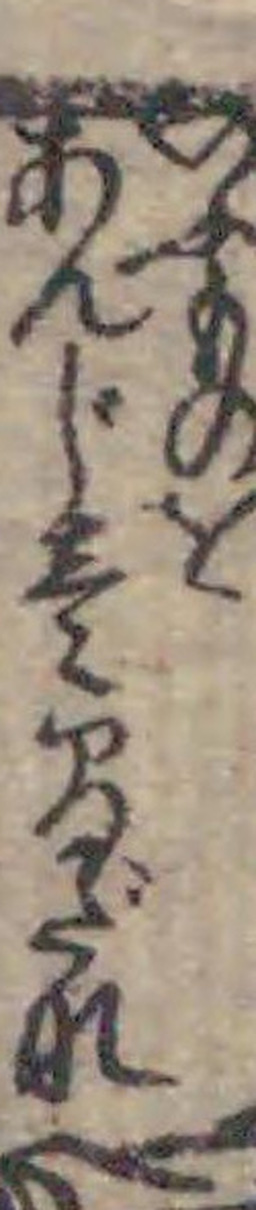あんじ壱間だれ
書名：本樹真猿浮気噺 : 3巻
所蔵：国立国会図書館 National Diet Library, JAPAN
